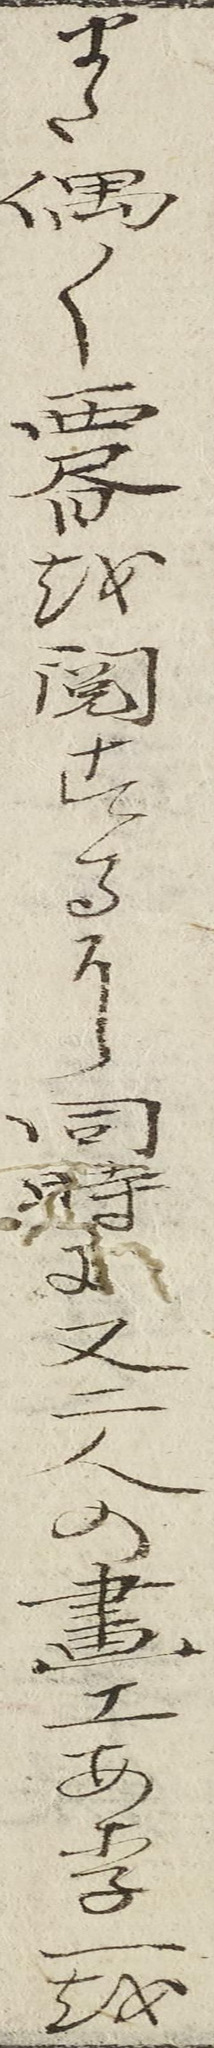また偶〳〵西書を閲するに同時に又二人の画工あり一を
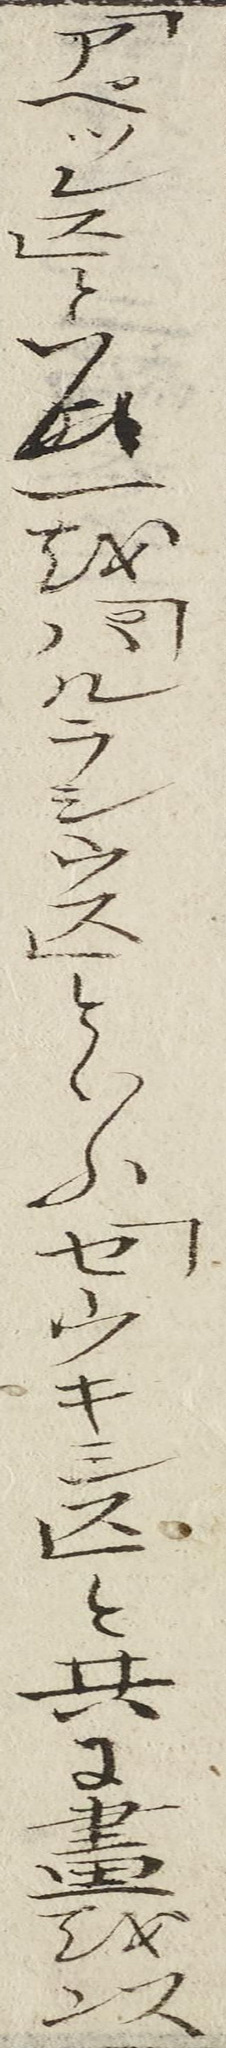「アぺッレス」といひ一を「パルラシウス」といふ「セウキシス」と共に画を以
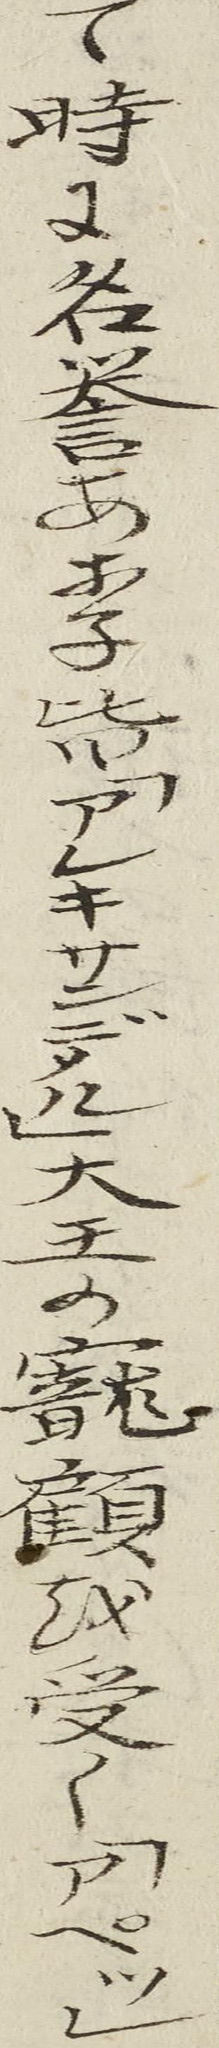て時に名誉あり皆「アレキサンデル」大王の寵顧を受く「アぺッレ
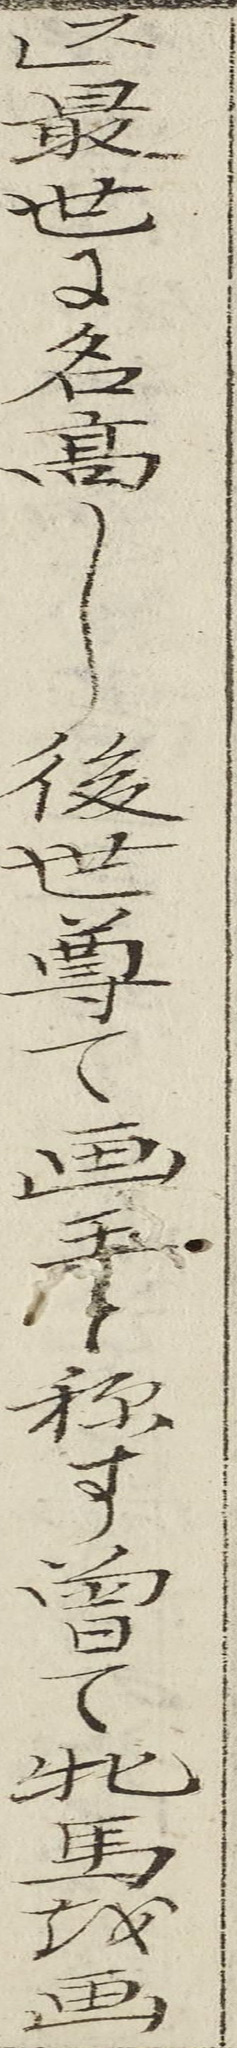ス」最世に名高し後世尊て画王と称す曽て牝馬を画
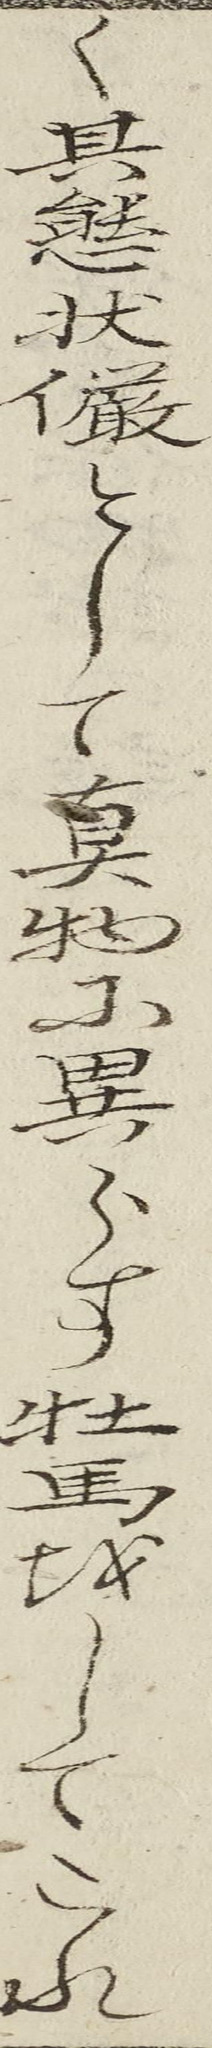く其態状厳として真物に異らす牡馬をしてこれ
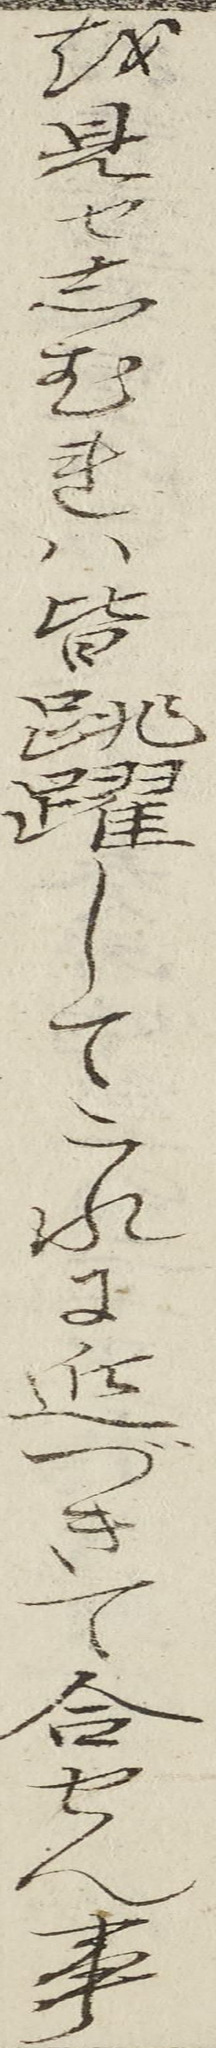を見せしむれは皆跳躍してこれに近づきて合せん事
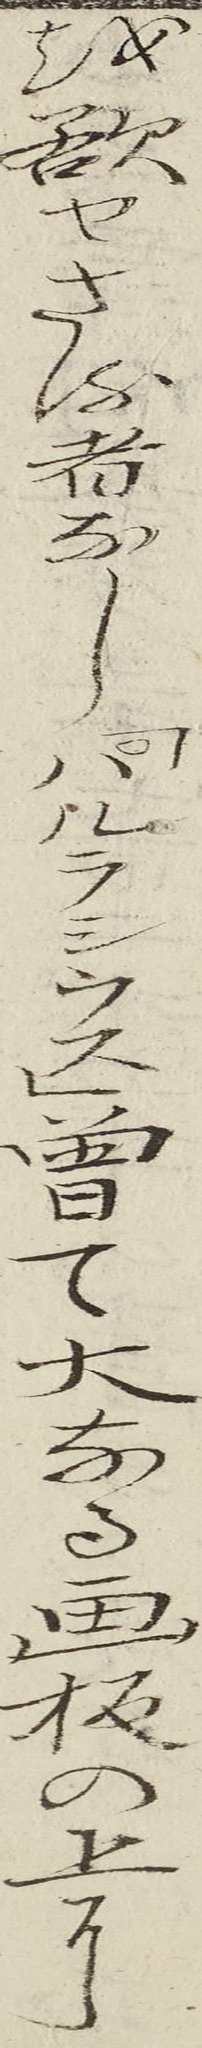を欲せさる者なし「パルラシウス」曽て大なる画板の上に
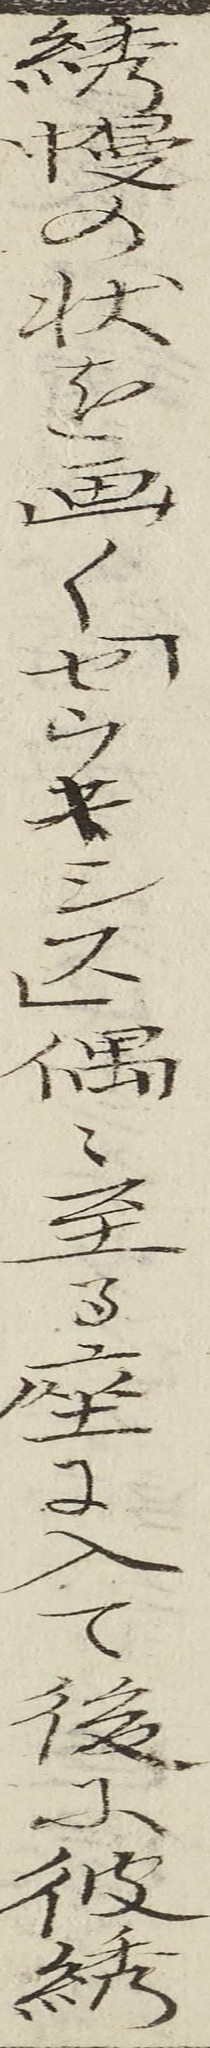繡幔の状を画く「セウキシス」偶〻至る座に入て後に彼繡
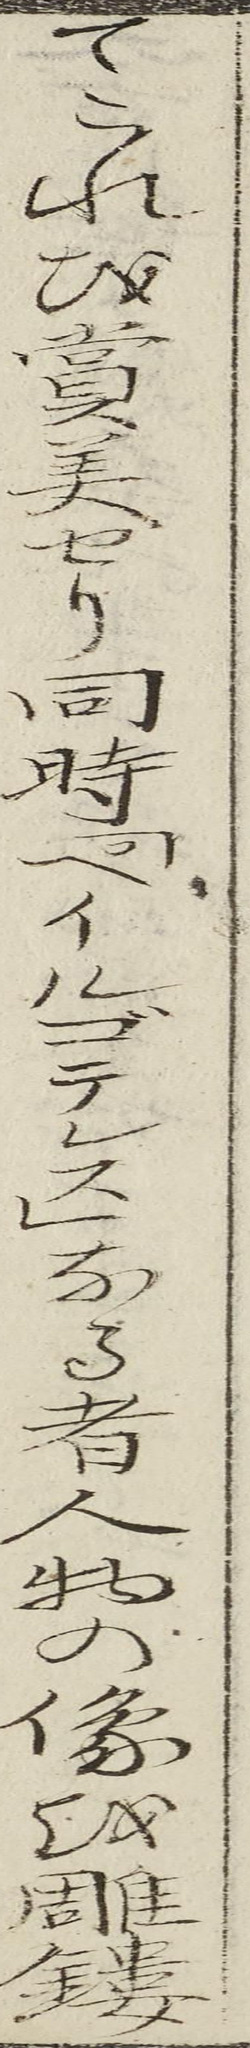てこれを賞美せり同時「ぺイルゴテレス」なる者人物の像を彫鏤
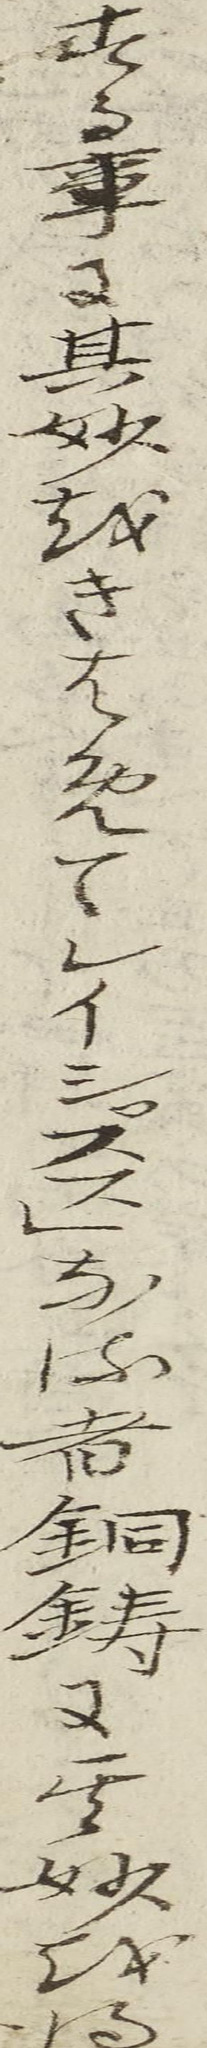する事に其妙をきはめてレイシ。スス」なる者銅鋳に其妙を恃
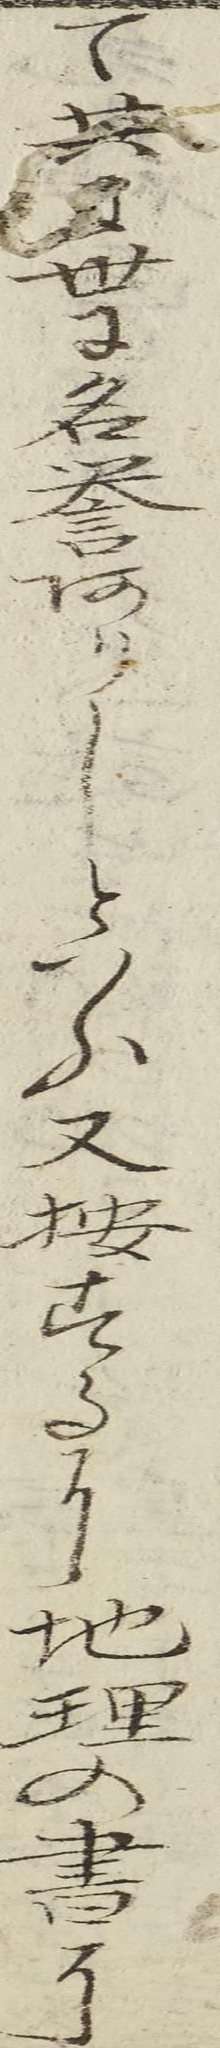て共に世に名誉ありしといふ又按するに地理の書に
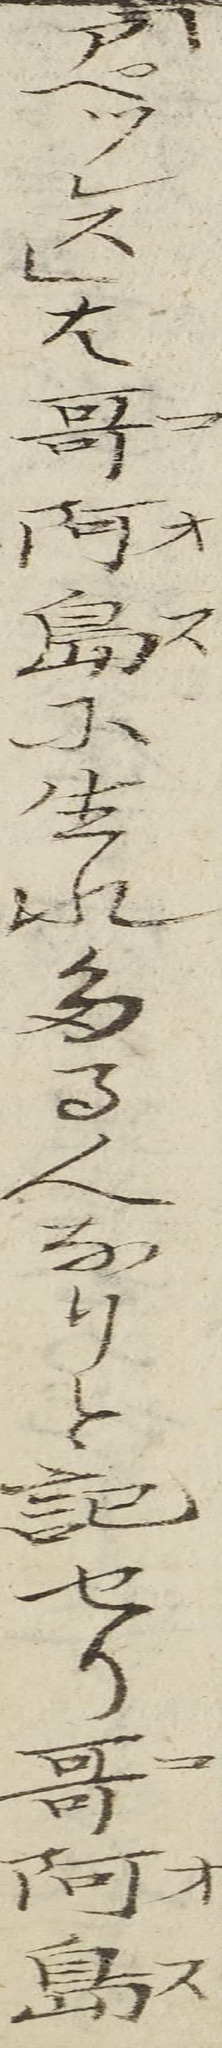「アぺッレス」は哥阿島に生れたる人なりと記せり哥阿島

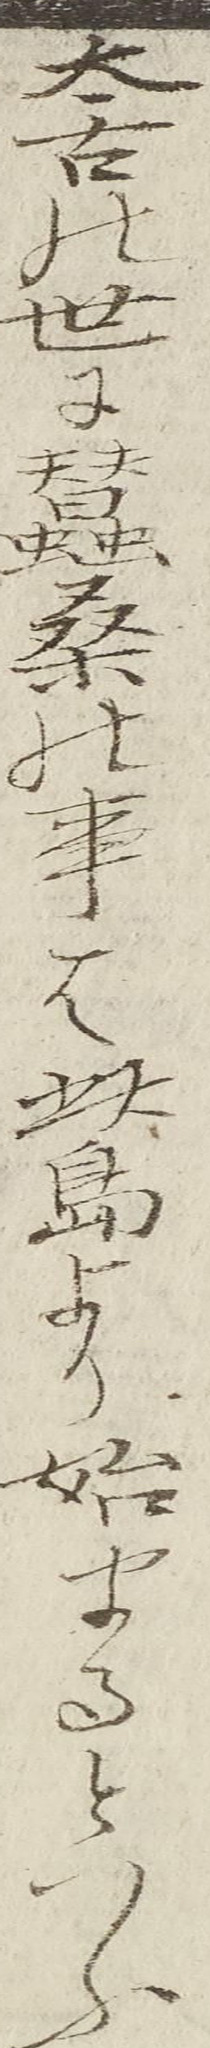太古の世に蚕桑の事は此島より始まるといふ
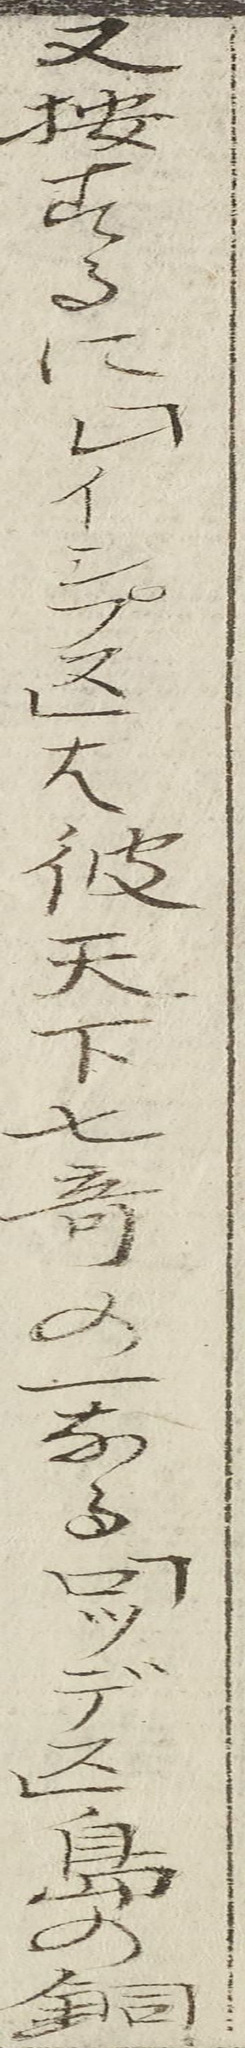又按するに「レインプス」は彼天下七奇の一なる「ロッデス」島の銅
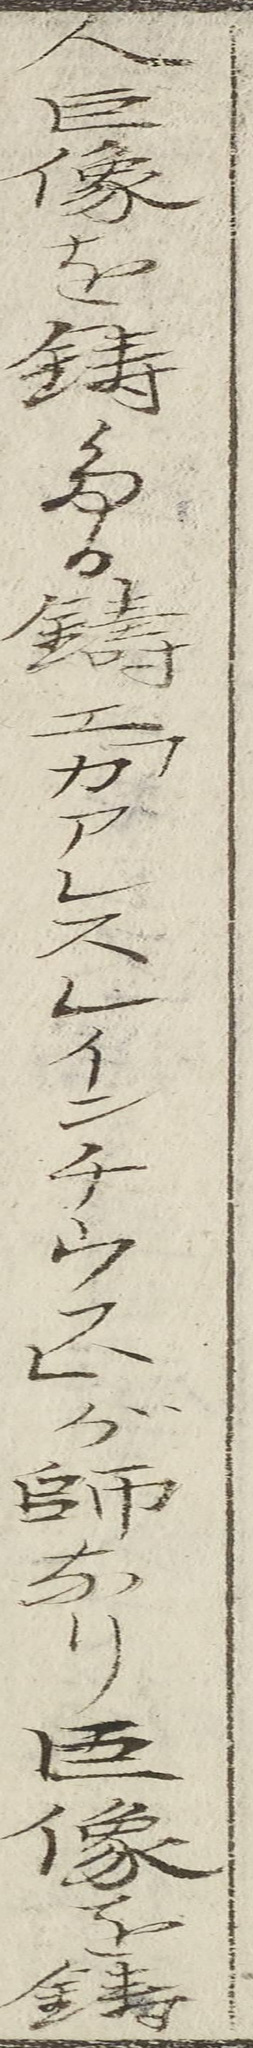人巨像を鋳たる鋳工「カアレスレインチウス」が師なり巨像を鋳
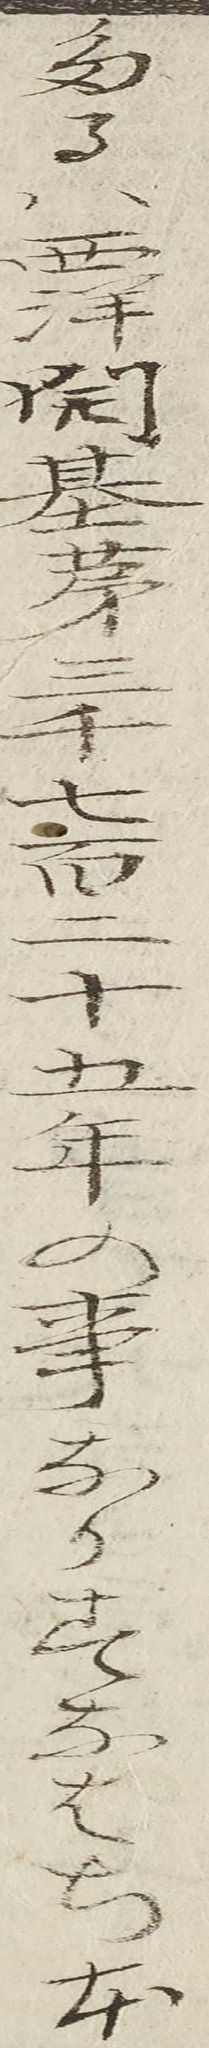たるは西洋開基第三千七百二十五年の事なりすなはち本
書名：西洋雜記　乾
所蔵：東京大学地震研究所図書室 Earthquake Research Institute Library, The University of Tokyo, JAPAN
